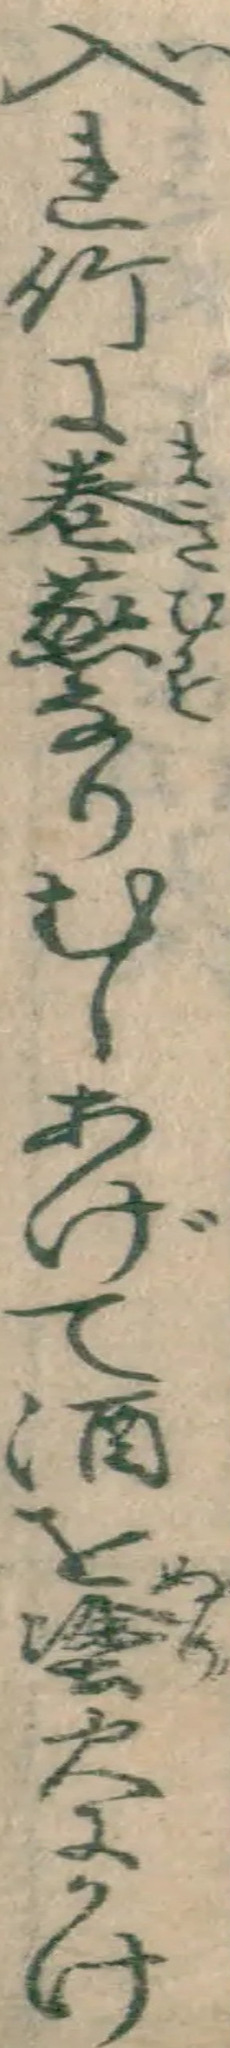入れ竹に巻蒸なりむしあげて酒を塗火にかけ

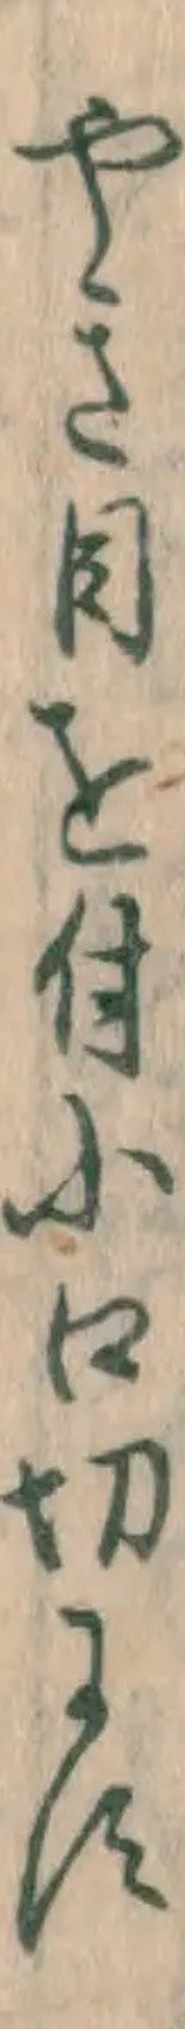やき目を付小口切にす
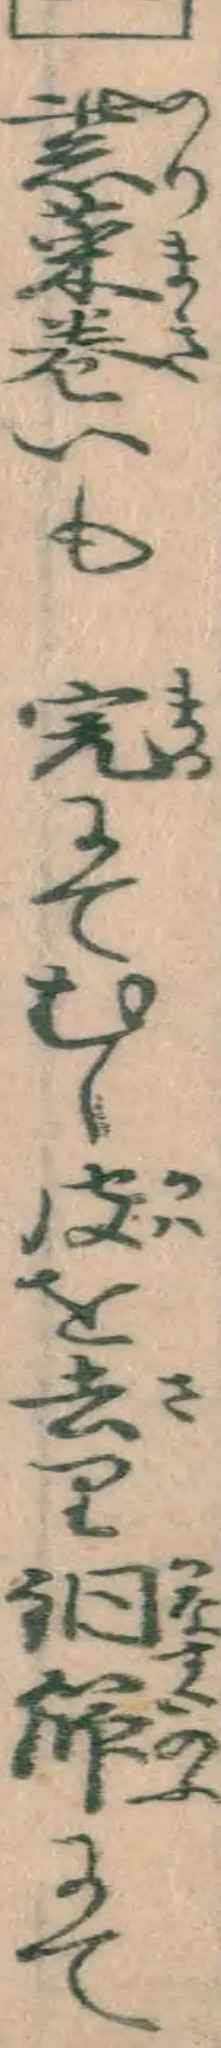[三]紫菜巻いも完にてむし皮を去り銅篩にて
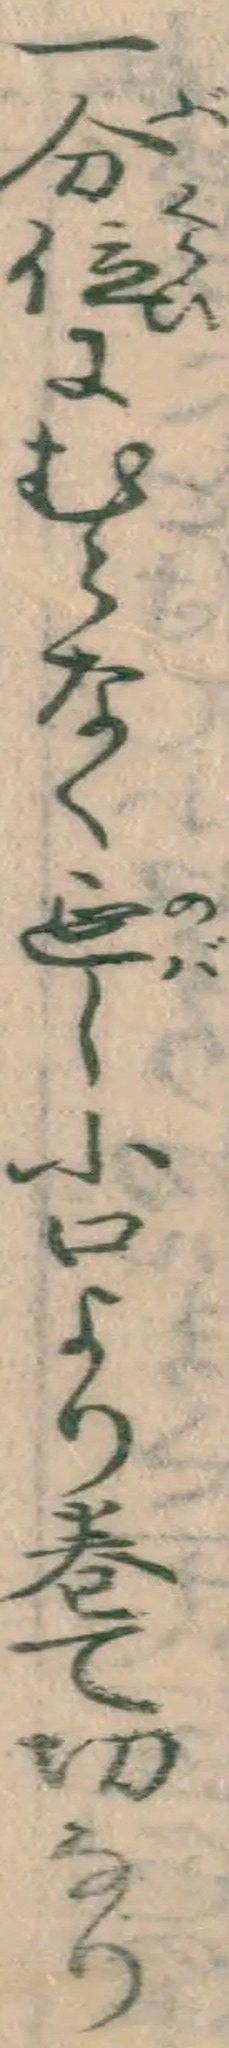一分位にむらなく延し小口より巻て切なり
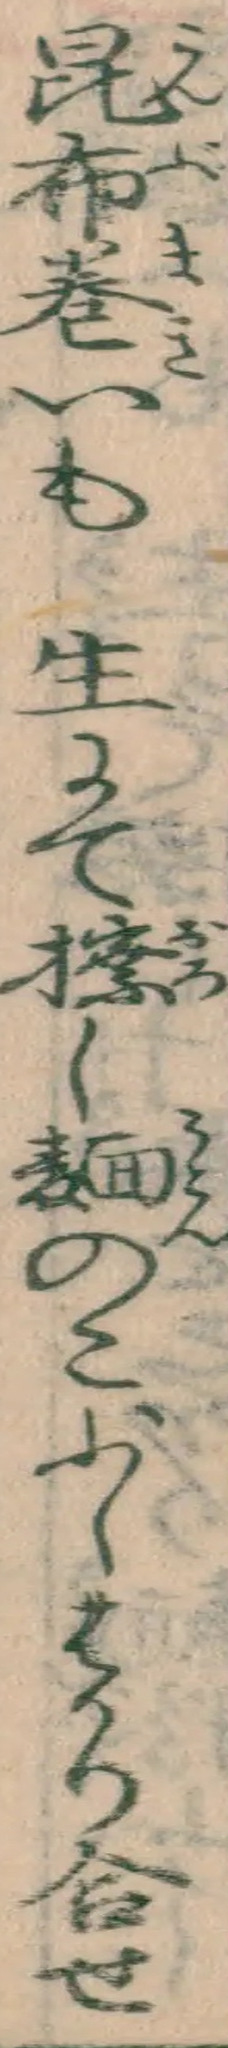[四]昆布巻いも生にて擦し麺のこ少しはかり合せ
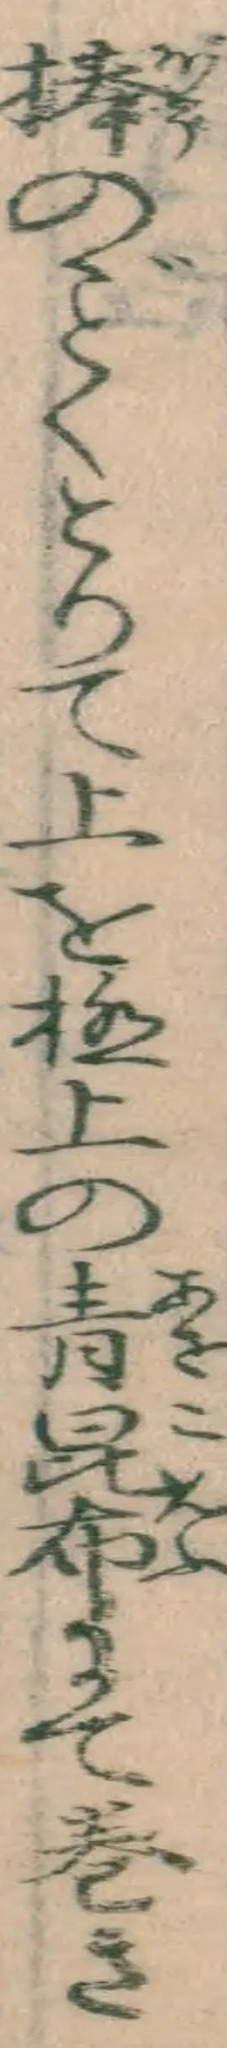棒のごとくとりて上を極上の青昆布にて巻き
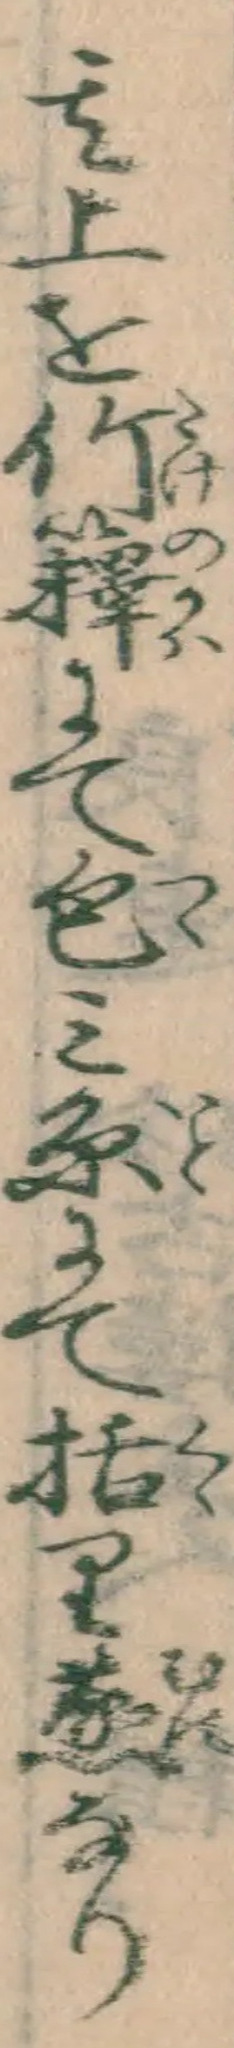其上を竹籜にて包み糸にて括り蒸なり
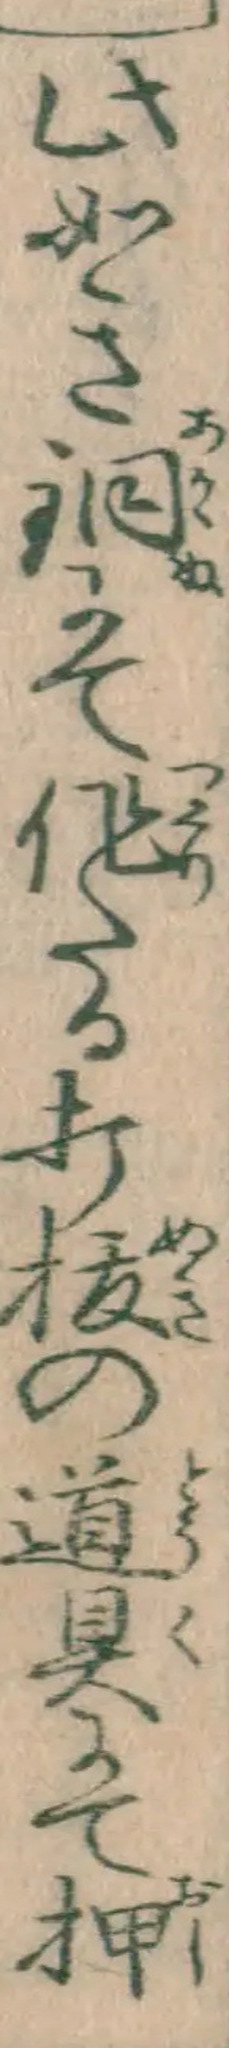此如き銅にて作たる打抜の道具にて押
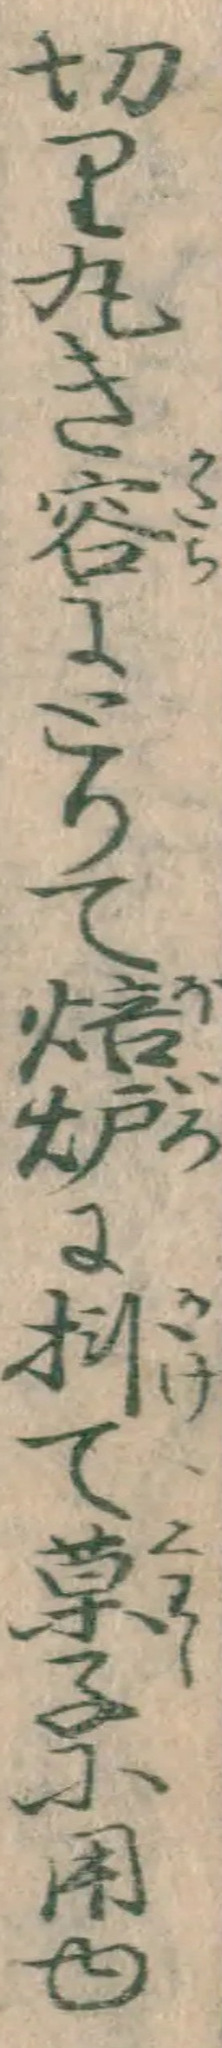切り丸き容にとりて焙炉に掛て菓子に用ゆ
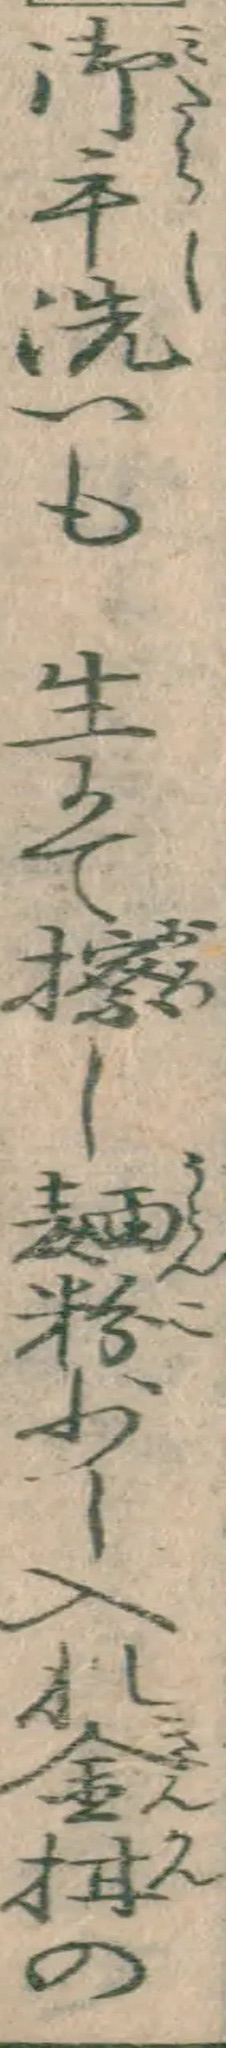[六]御手洗いも生にて擦し麺粉少し入れ金柑の
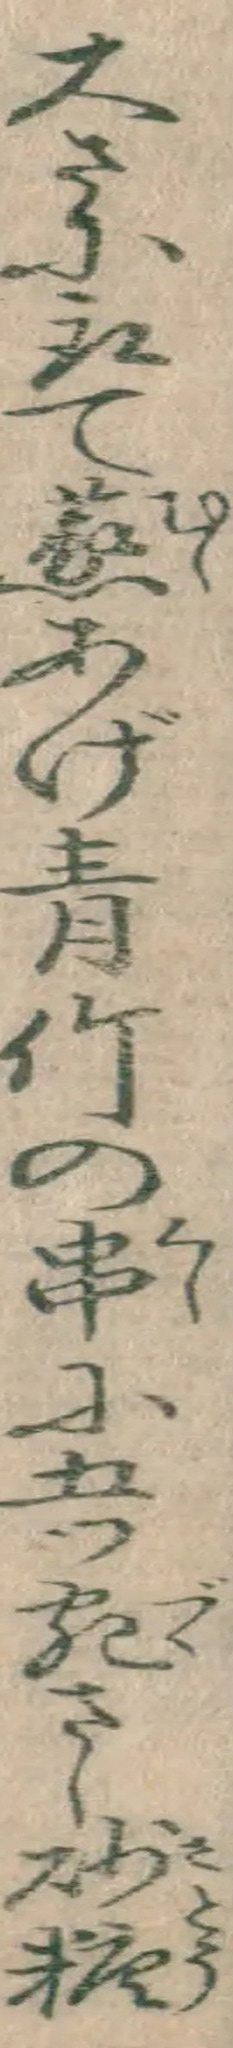大さに取て蒸あげ青竹の串に五つ宛さし砂糖
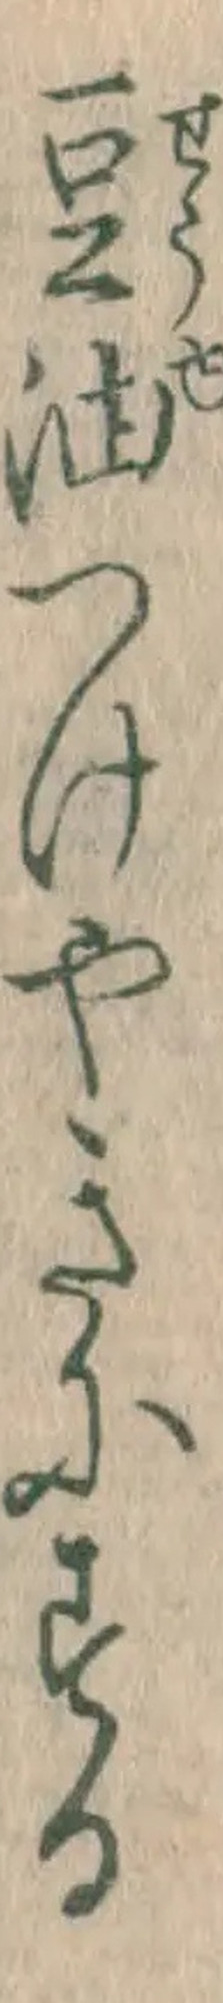豆油つけやきにする
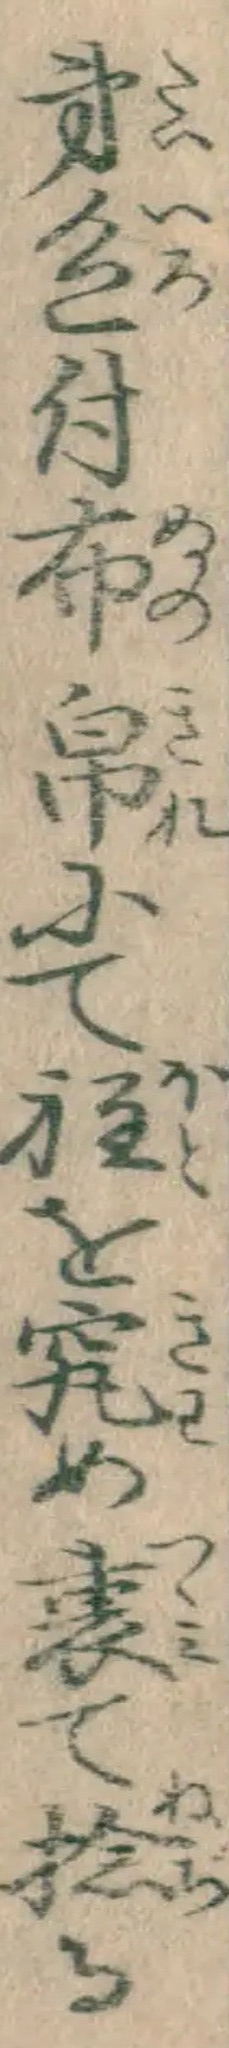第色付布帛にて程を究め裹て捻る

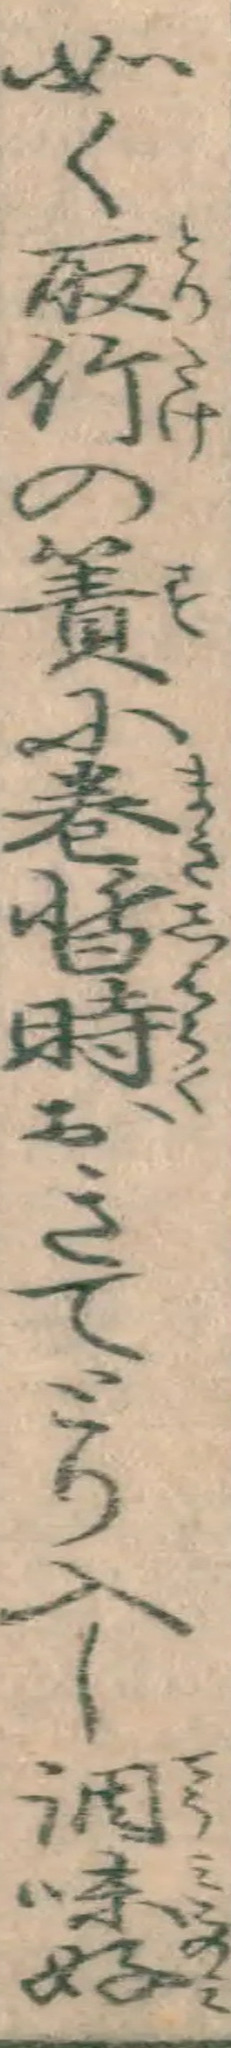如く取竹の簀に巻暫時おきてとり入し調味好
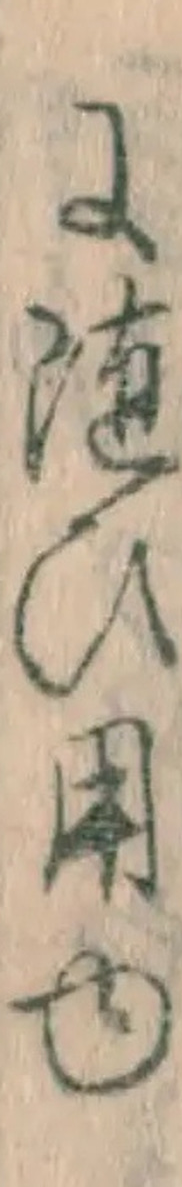に随ひ用ゆ
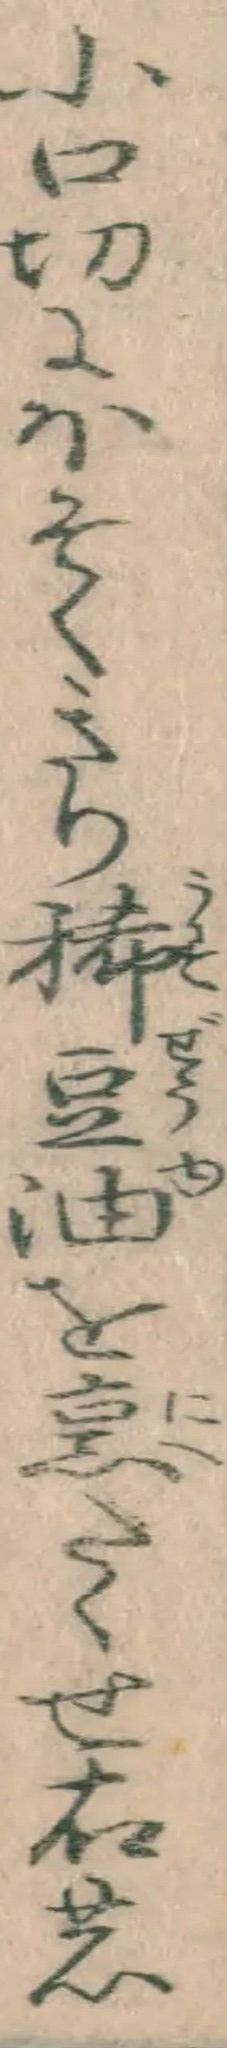小口切にほそくきり稀豆油を烹たゝせ右の
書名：甘藷百珍
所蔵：国立国会図書館 National Diet Library, JAPAN
